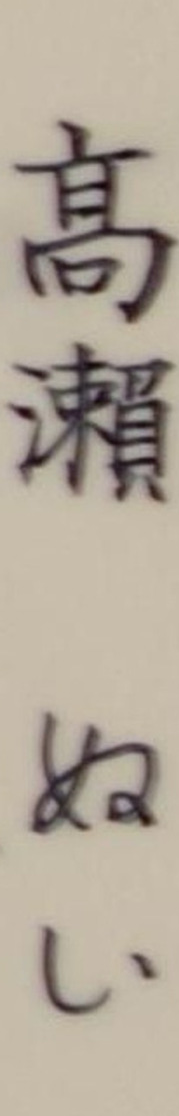高瀬ぬい
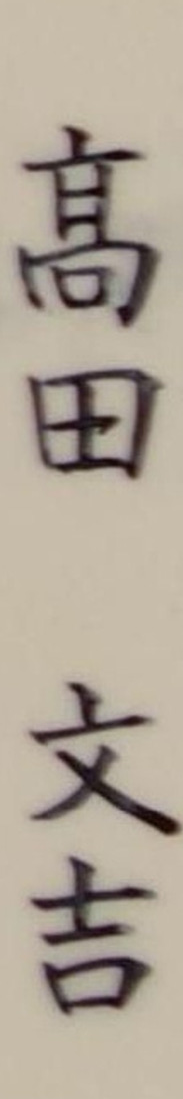高田文吉
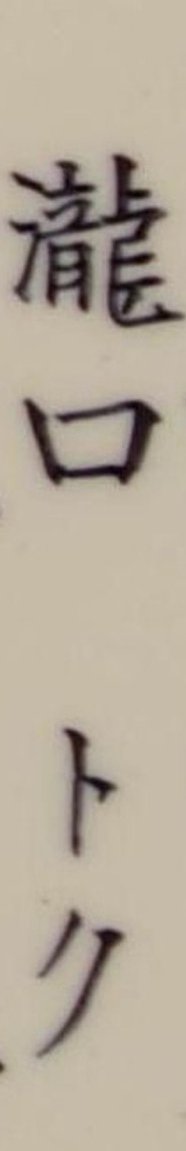瀧口トク
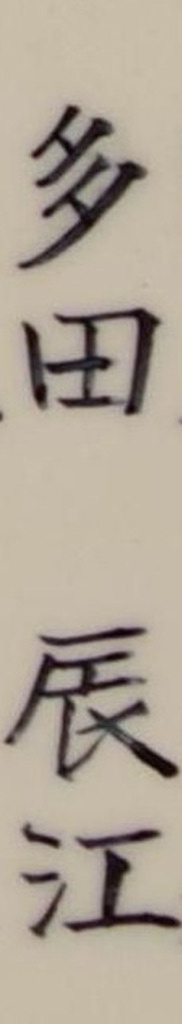多田辰江
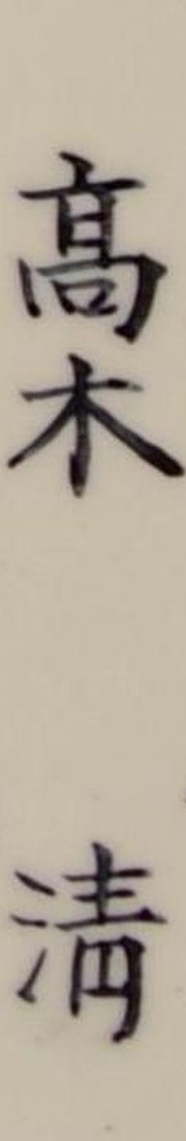高木清
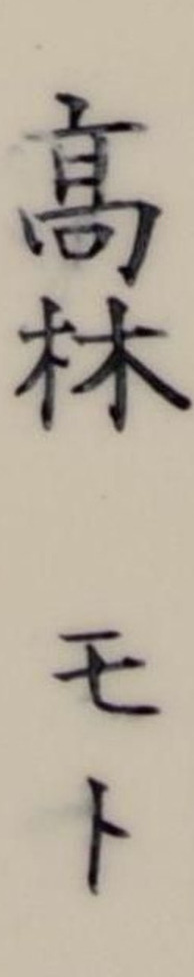高林モト
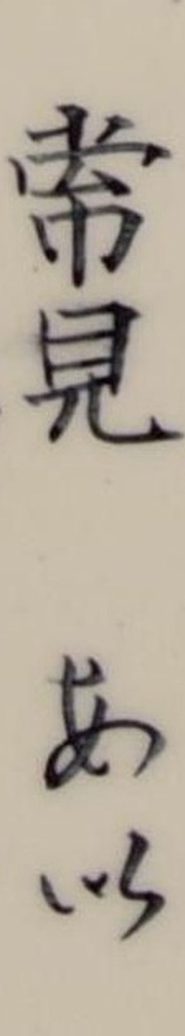常見あい
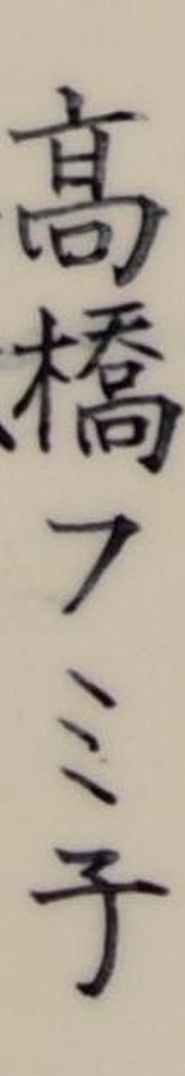高橋フミ子
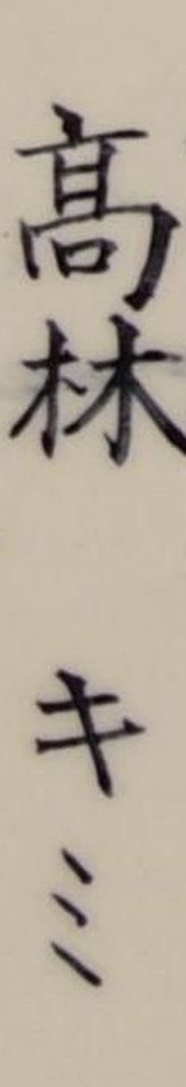高林キミ
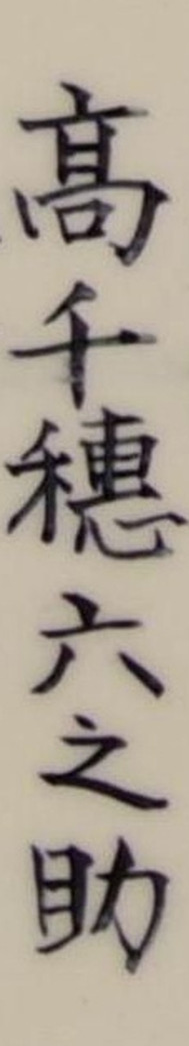高千穂六之助
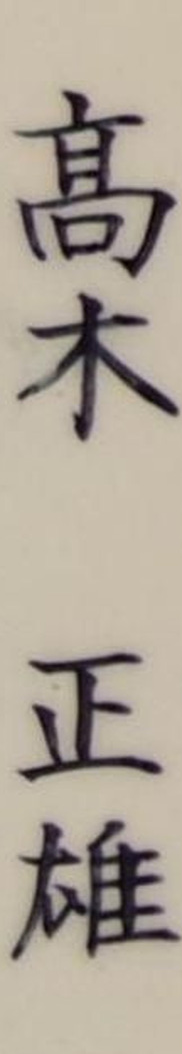高木正雄
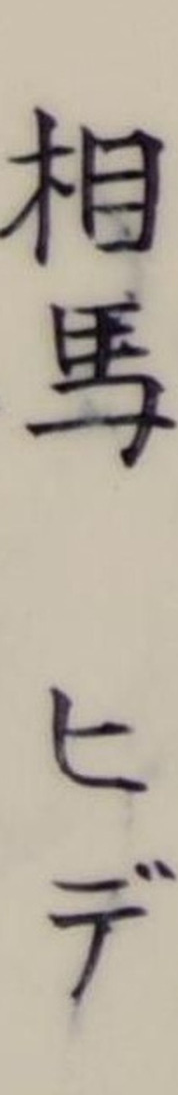相馬ヒデ
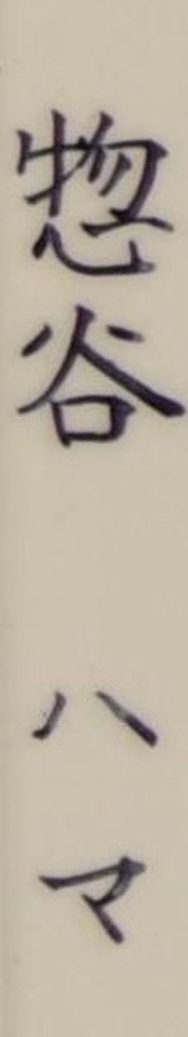惣谷ハマ

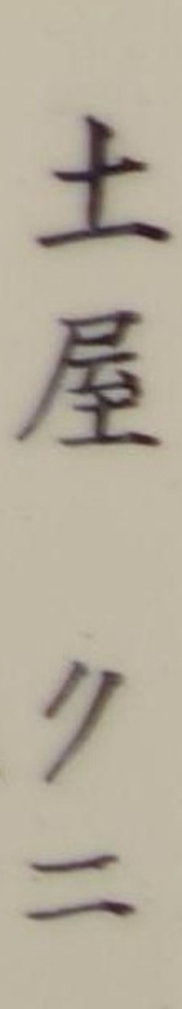土屋ク二
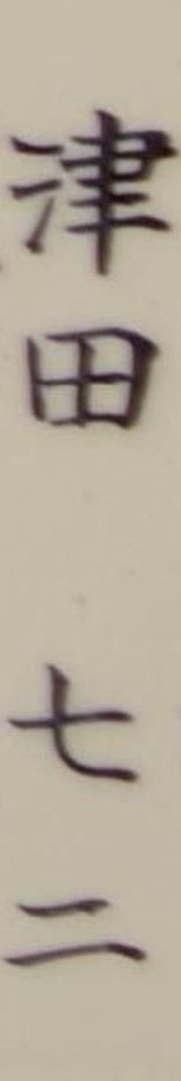津田七二
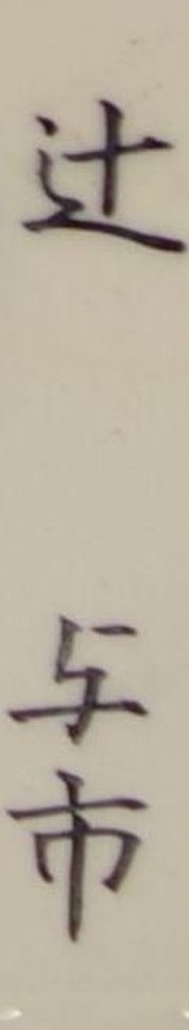辻与市
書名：M~S
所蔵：高野山金剛峯寺
